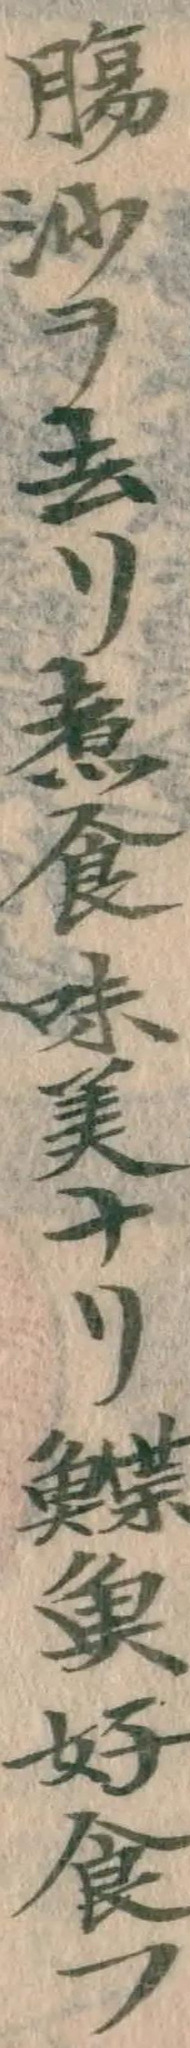腸沙ヲ去リ煮食味美ナリ鰈魚好食フ
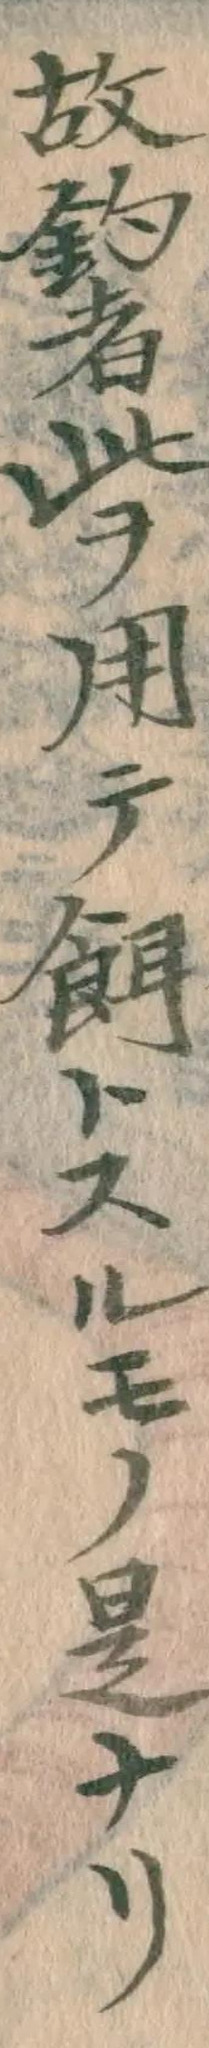故釣者此ヲ用テ餌トスルモノ是ナリ

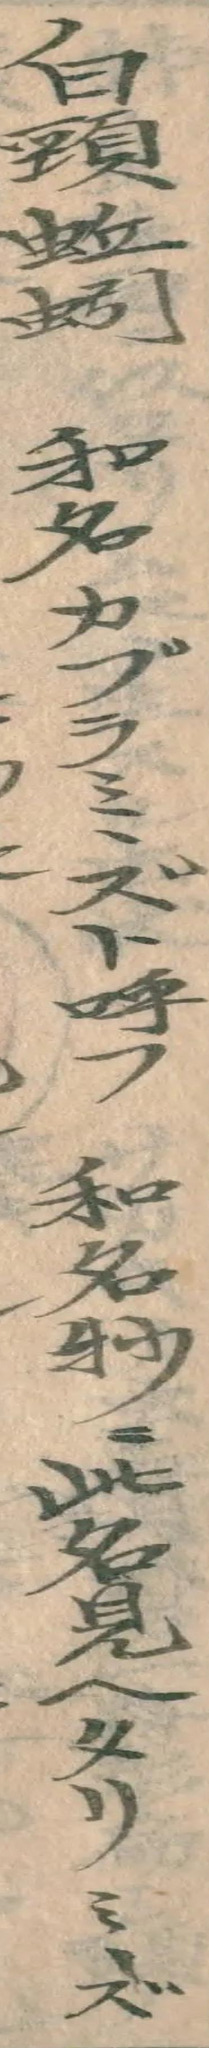白頸蚯蚓和名カブラミヽズト呼フ和名抄ニ此名見ヘタリミヽズ
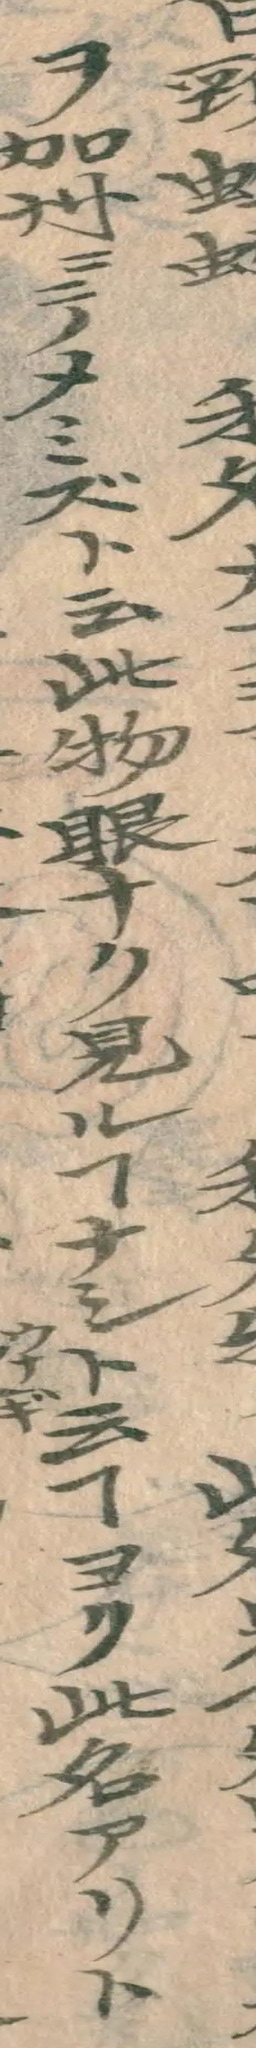ヲ加州ニテメミズト云此物眼ナク見ルコトナシト云コトヨリ此名アリト
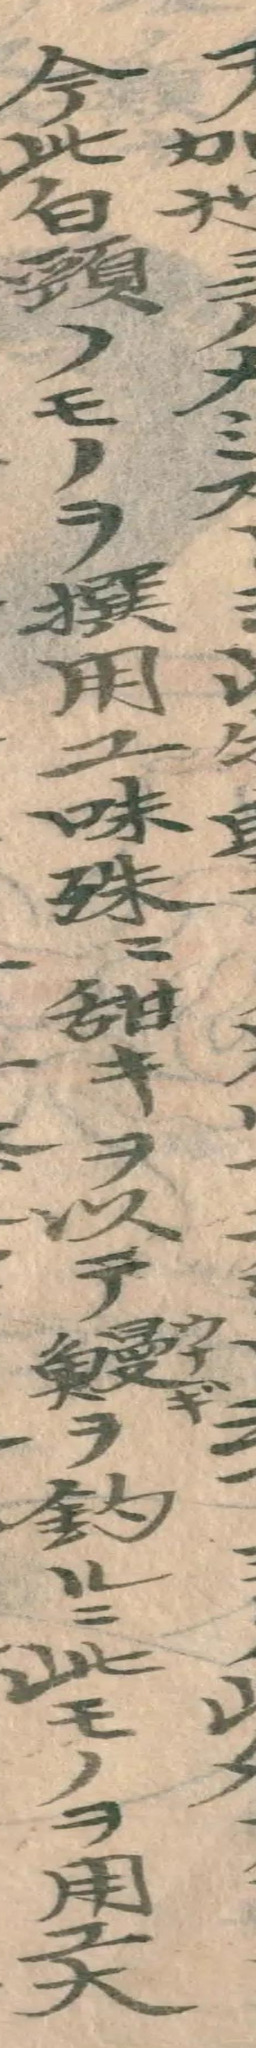今此白頸ノモノヲ撰用ユ味殊ニ甜キヲ以テ鰻ヲ釣ルニ此モノヲ用ユ大
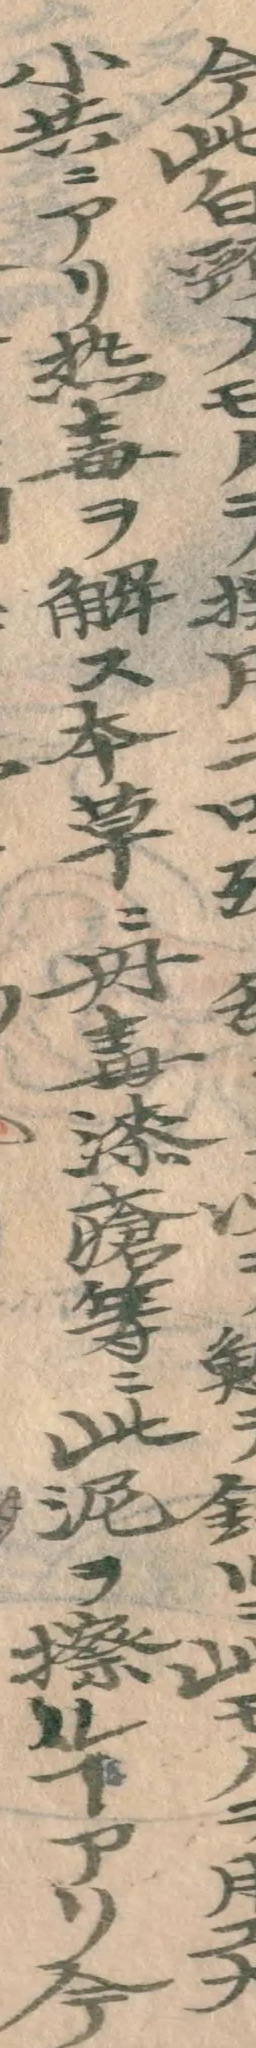小共ニアリ熱毒ヲ解ス本草ニ丹毒漆瘡等ニ此泥ヲ擦ルコトアリ今
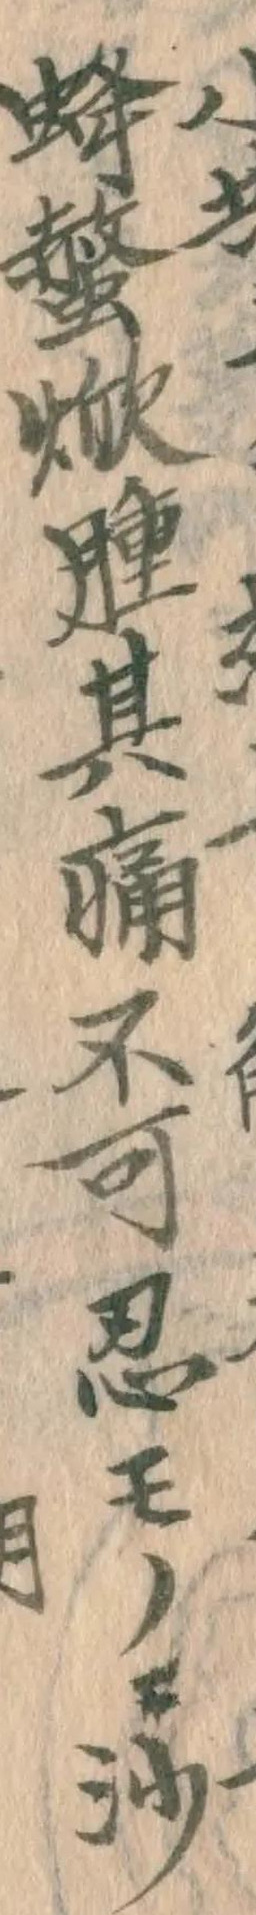蜂螫焮腫其痛不可忍モノに沙
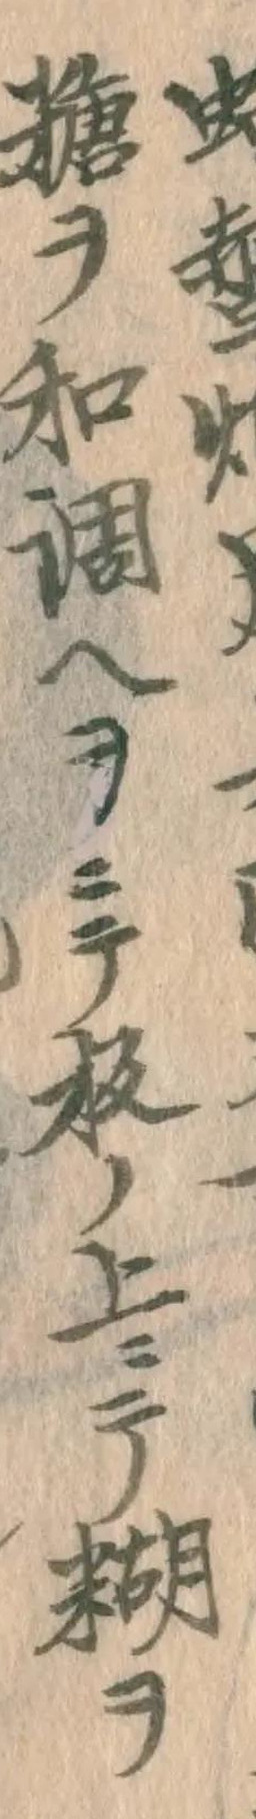糖ヲ和調ヘヲニテ板ノ上ニテ糊ヲ
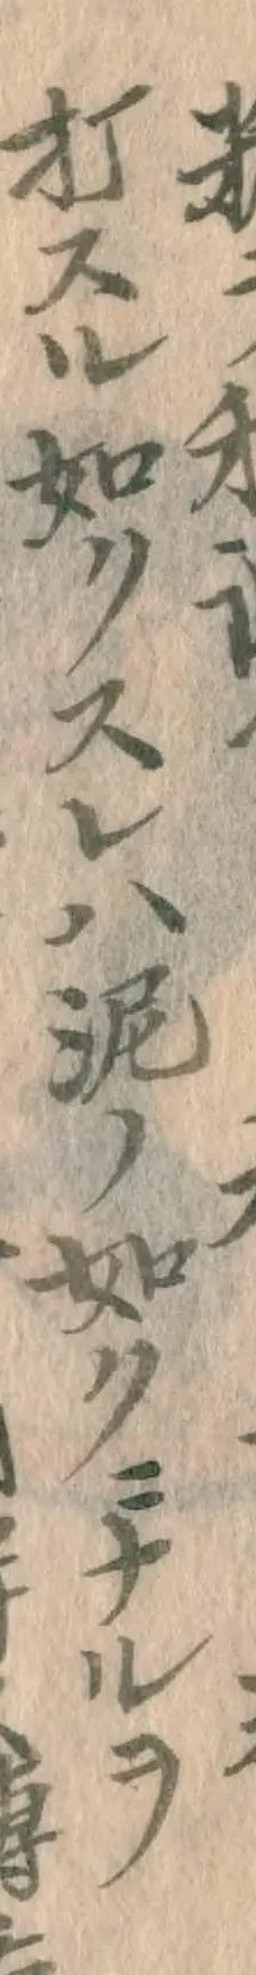打スル如クスレハ泥ノ如クニナルヲ
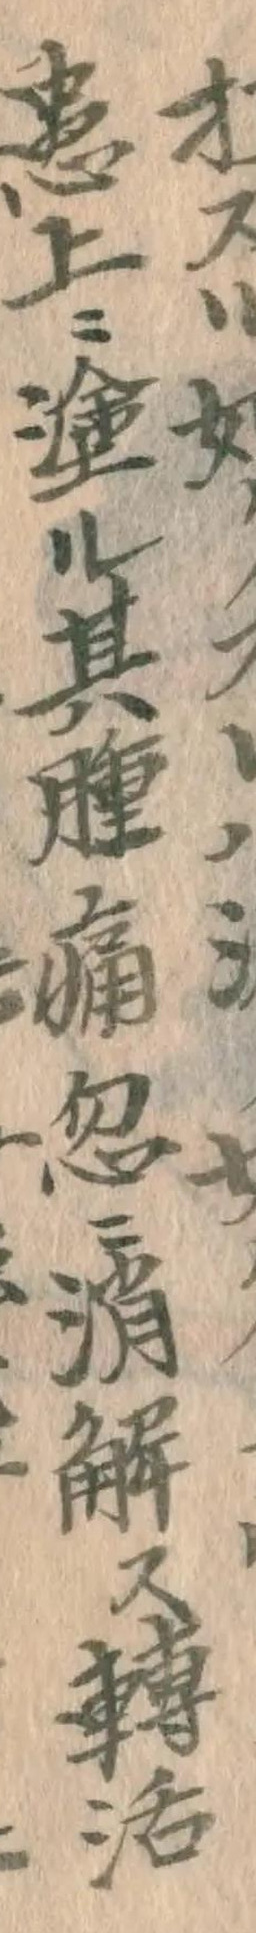患上ニ塗ル其腫痛忽ニ消解ス転活
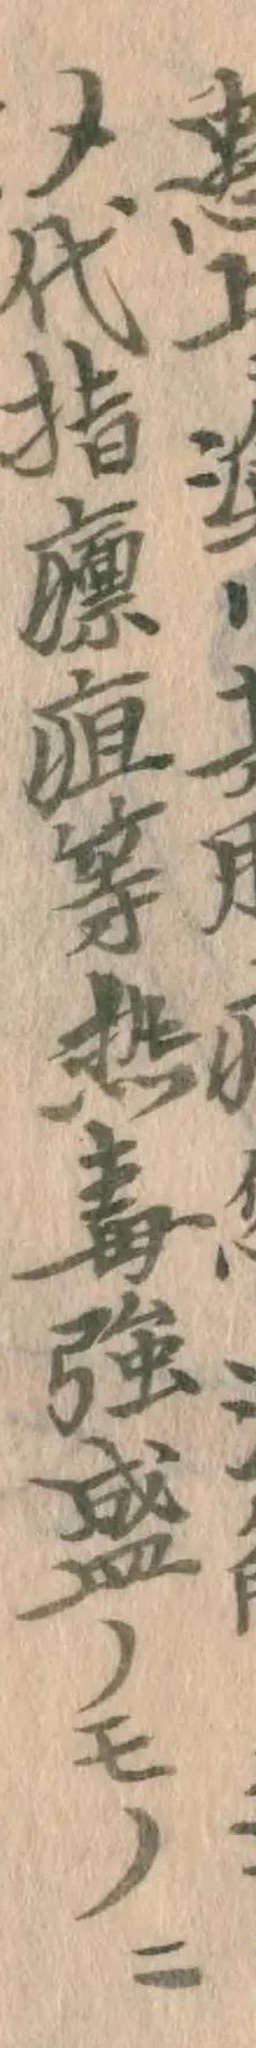シテ代指瘭疽等熱毒強盛ノモノニ
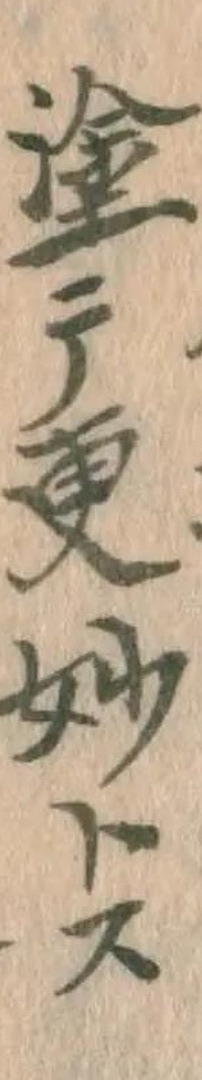塗テ更妙トス
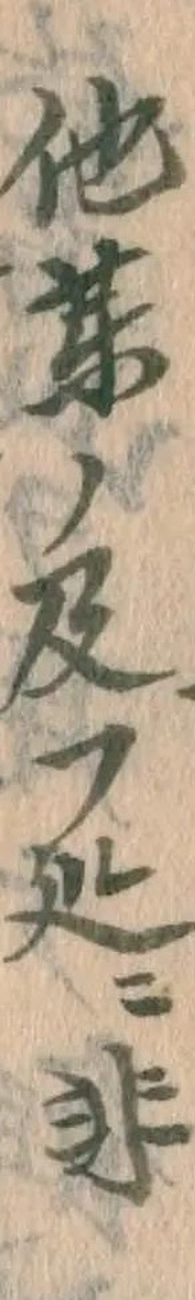他薬ノ及フ処ニ非
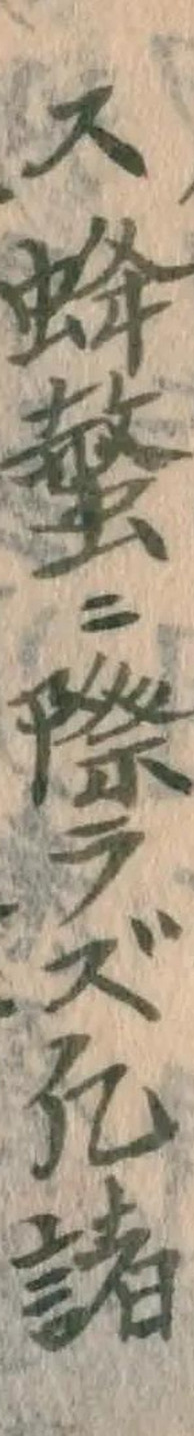ス蜂螫ニ際ラズ凢諸
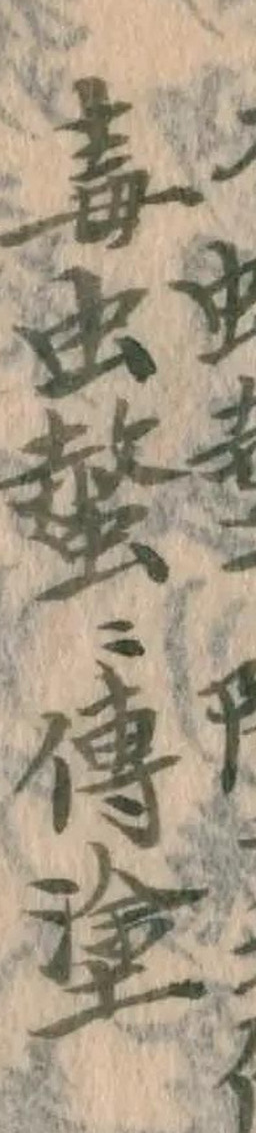毒虫螫ニ伝塗
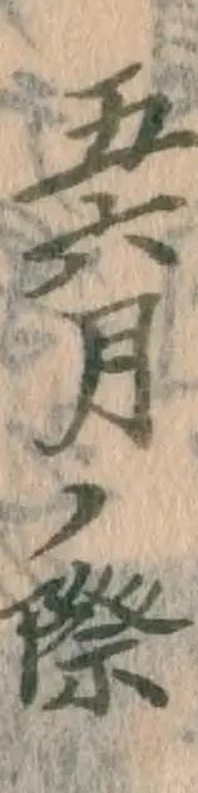五六月ノ際
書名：千蟲譜 3巻. [3]
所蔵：国立国会図書館 National Diet Library, JAPAN
